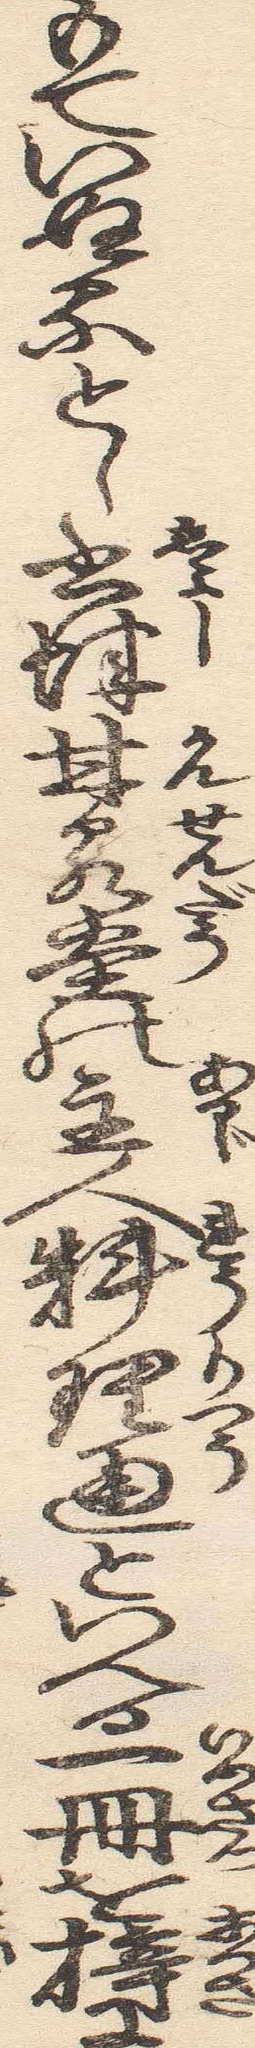もていぬるとし書肆甘泉堂の主人料理通といへる一冊を梓に
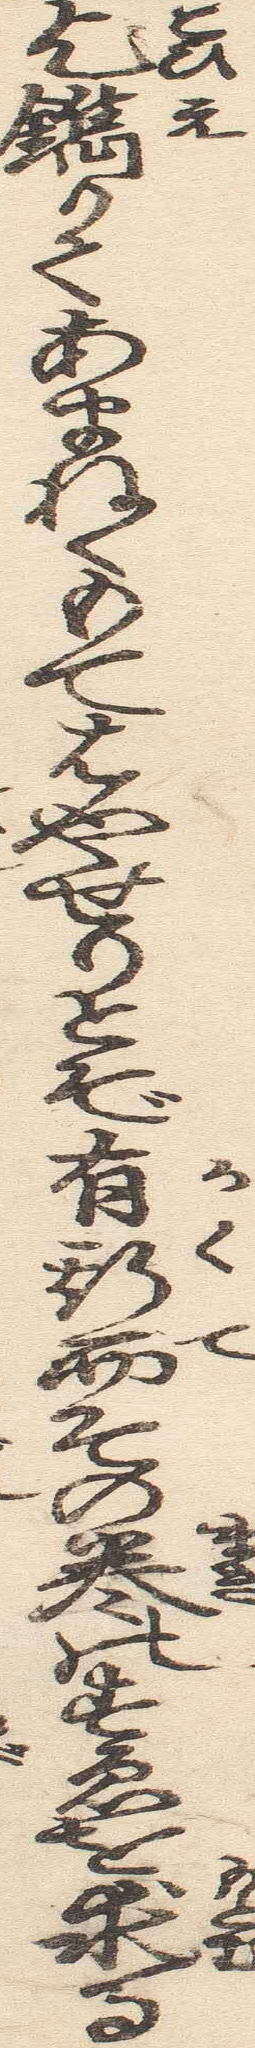乞鐫りてあまねくもてはやせりとぞ有斯而その巻のすゑを求る
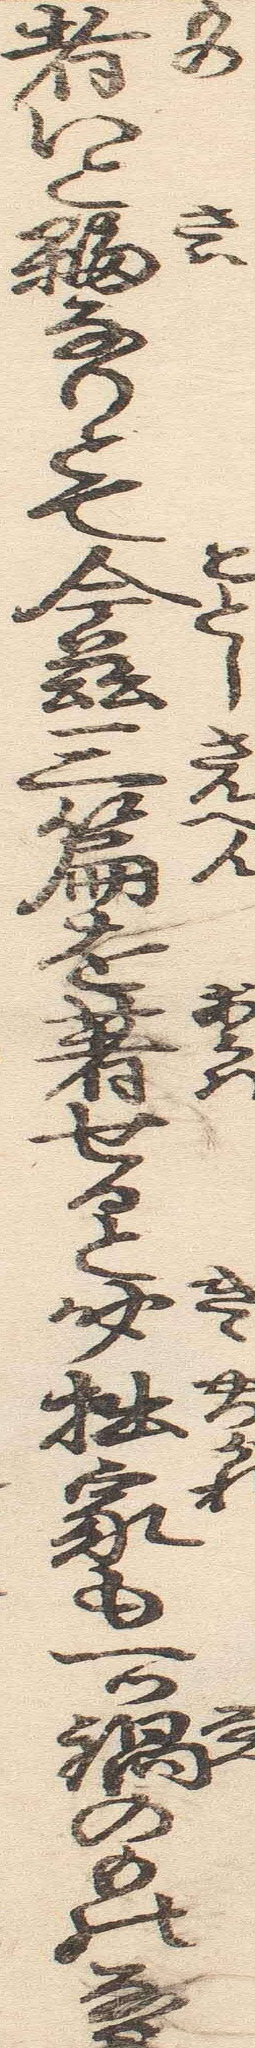者いと夥なりとて今茲三篇を著せると聞拙家も一つ鍋のものなる
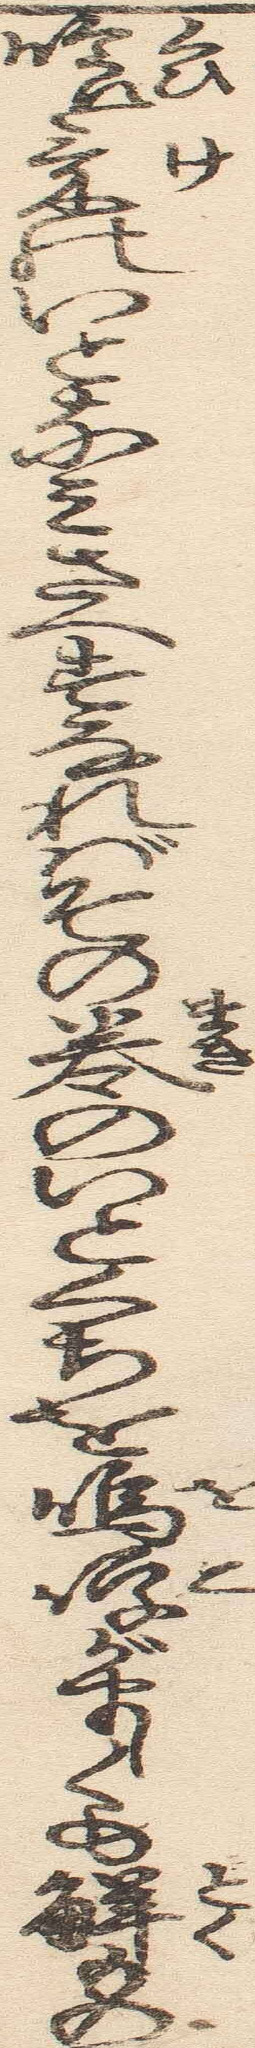喰気のいとなみさへすなればその巻のいとくちを嗚呼がましくも解もの
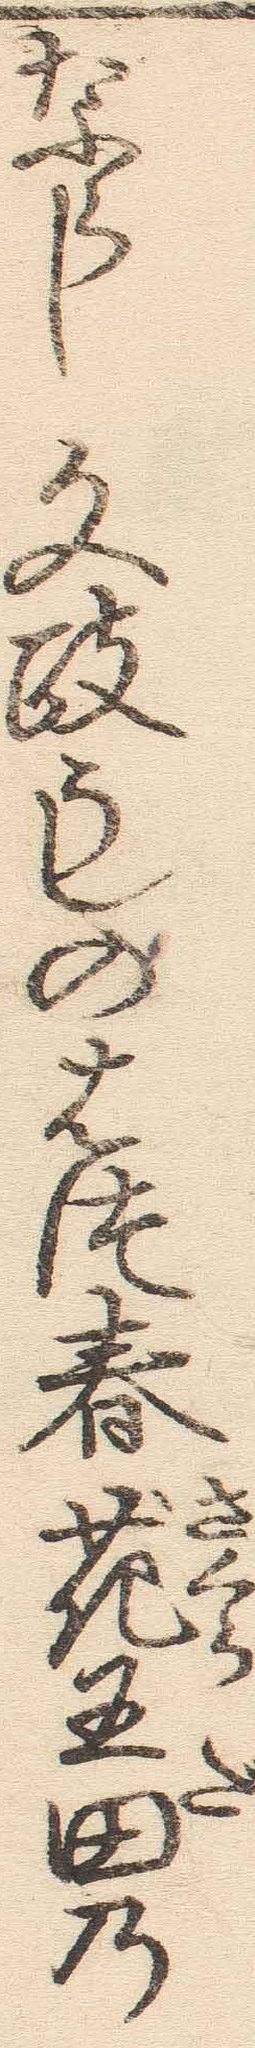ならし文政うしのはつ春花王田の
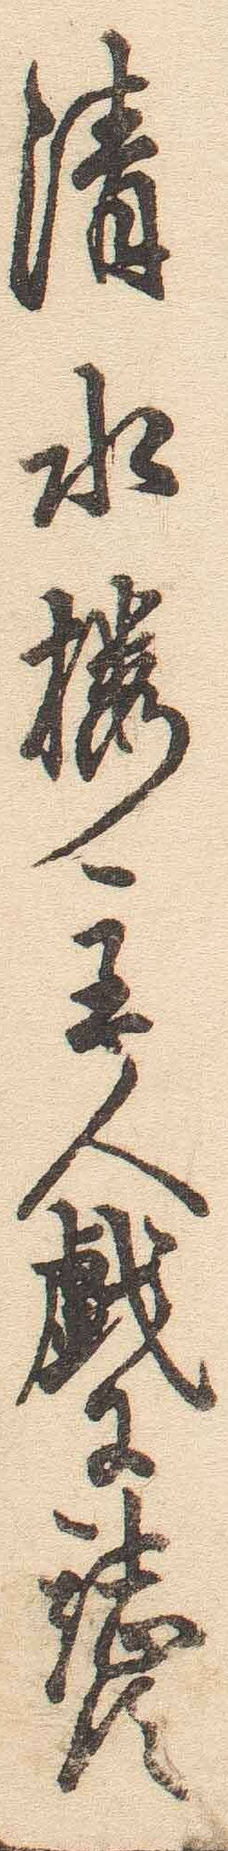清水楼主人戯に誌す

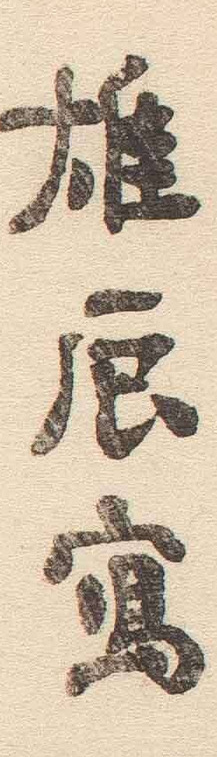雄辰写
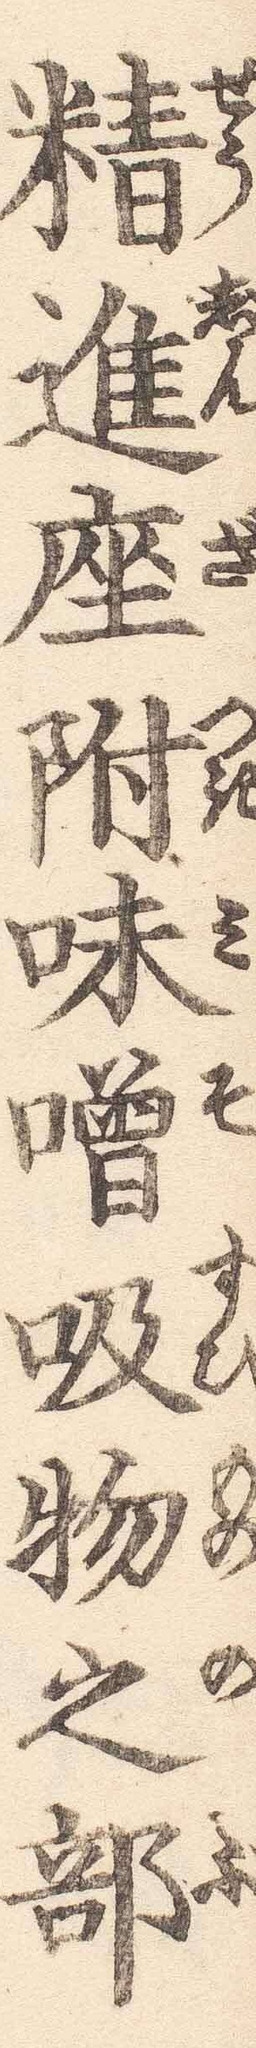精進座附味噌吸物之部
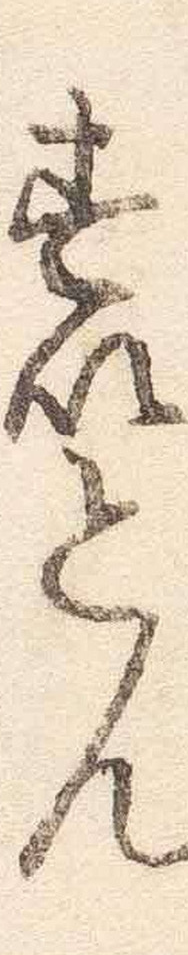すいとん
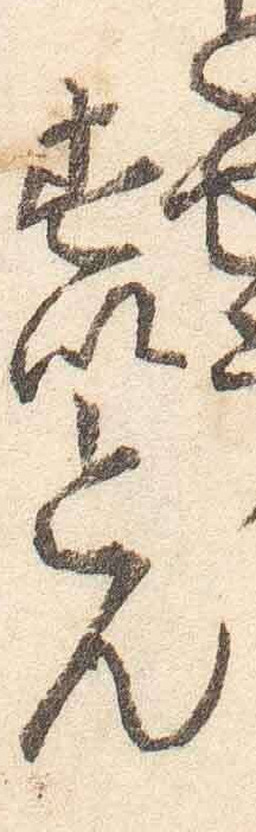すいとん
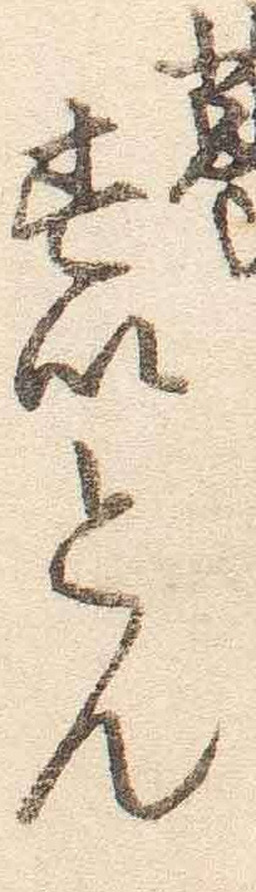すいとん

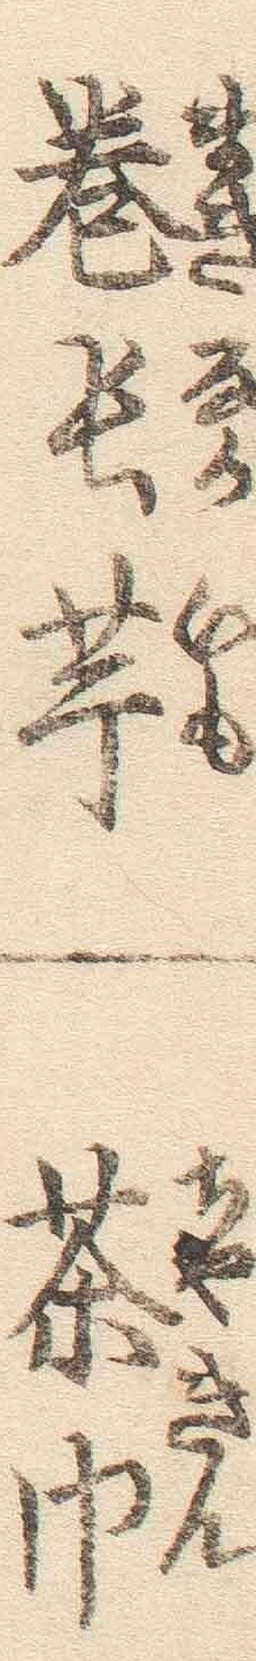巻長芋茶巾
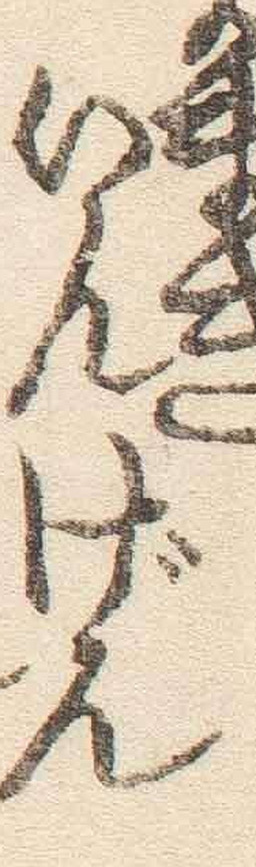いんげん
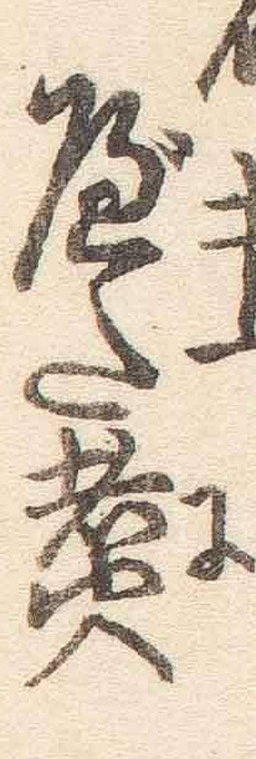べた煮
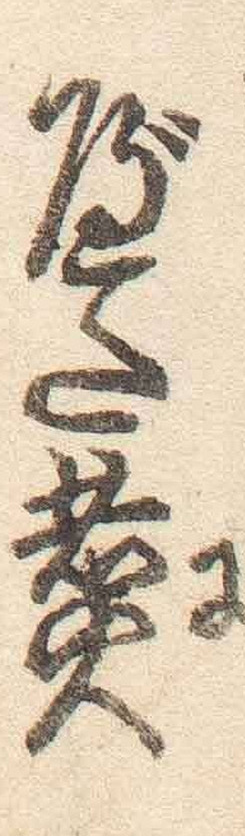べた煮
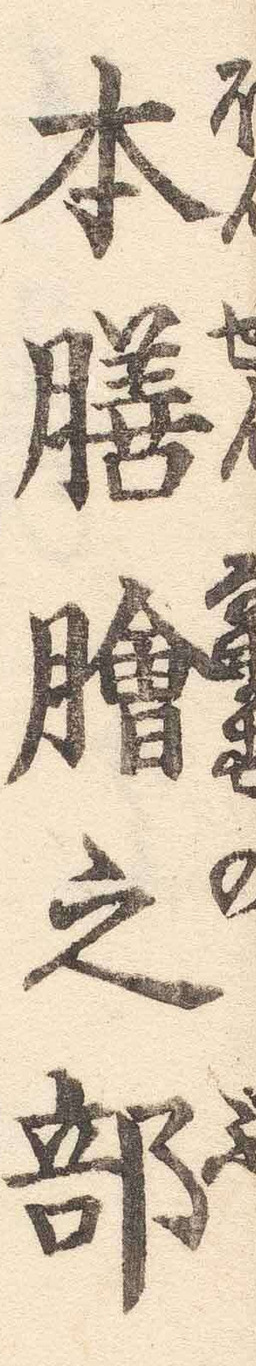本膳鱠之部
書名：料理通
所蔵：東京学芸大学附属図書館 国文学研究資料館
